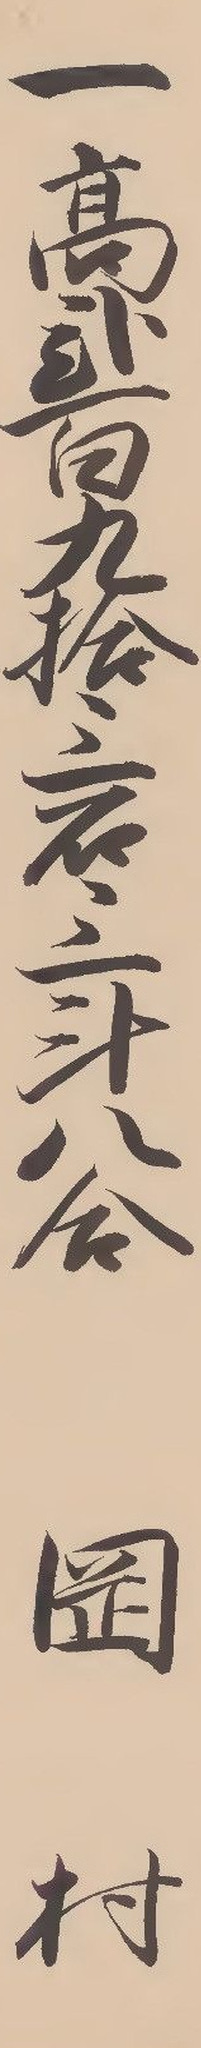一高弐百九拾三石三斗八合岡村
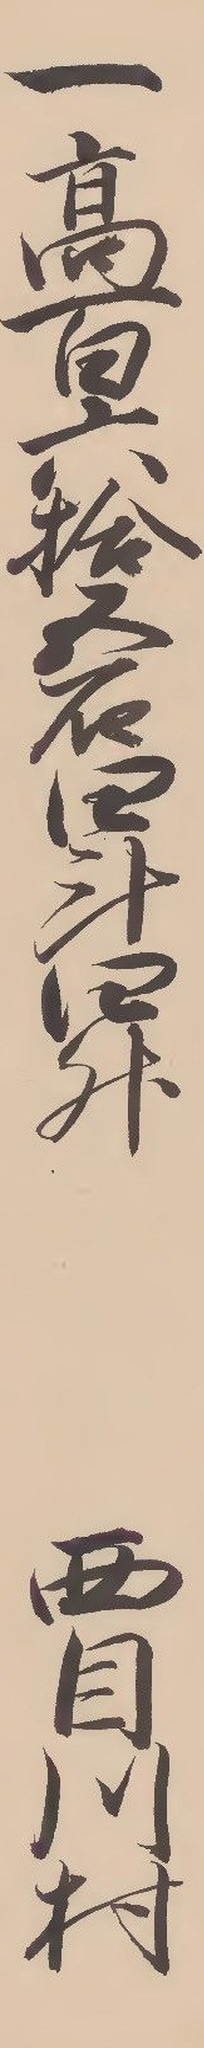一高百六拾五石四斗四升西目川村

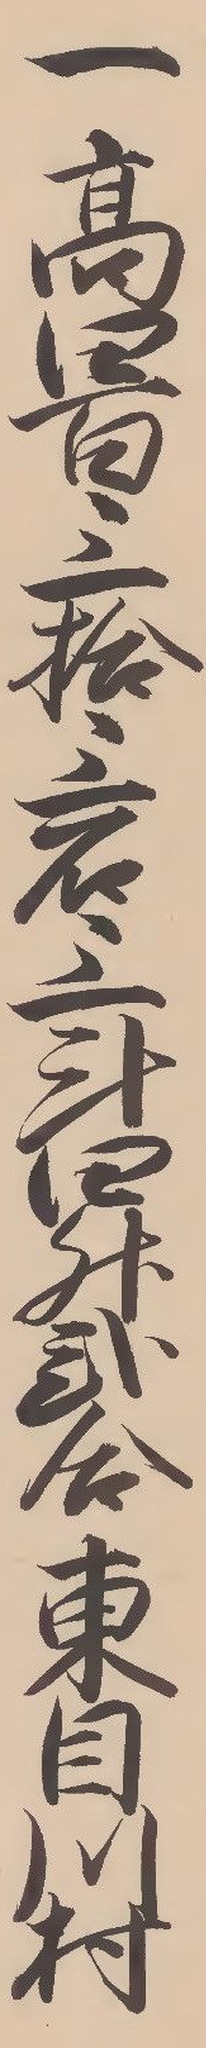一高四百三拾三石三斗四升弐合東目川村
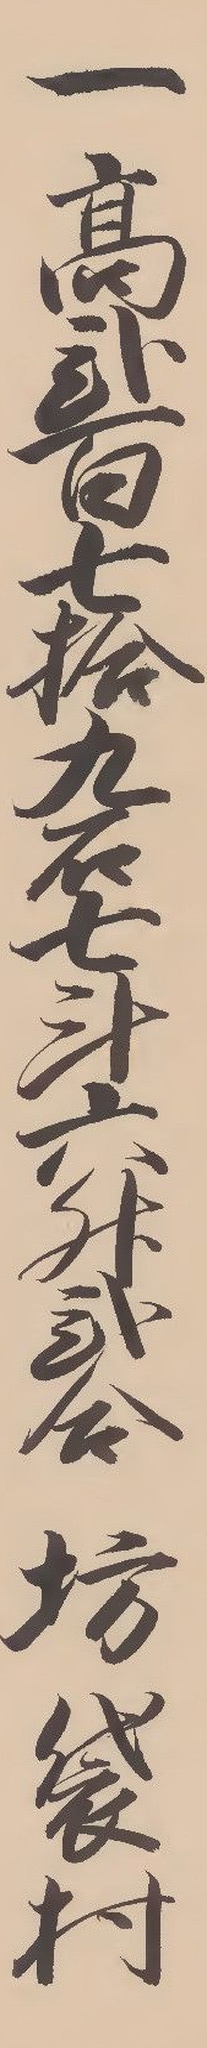一高弐百七拾九石七斗六升弐合坊袋村
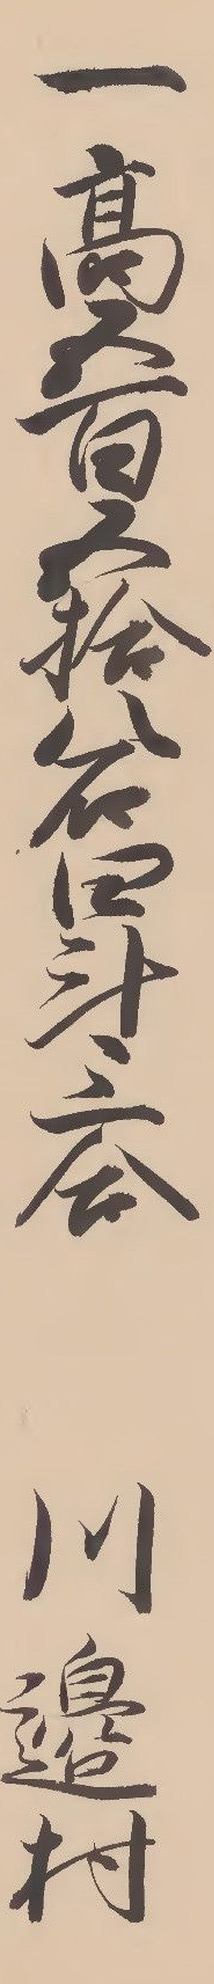一高五百五拾八石四斗三合川辺村
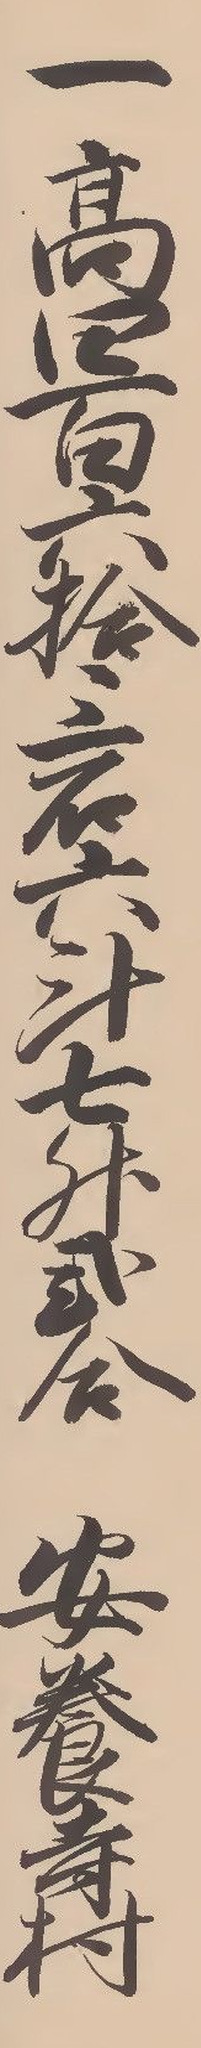一高四百六拾三石六斗七升弐合安養寺村
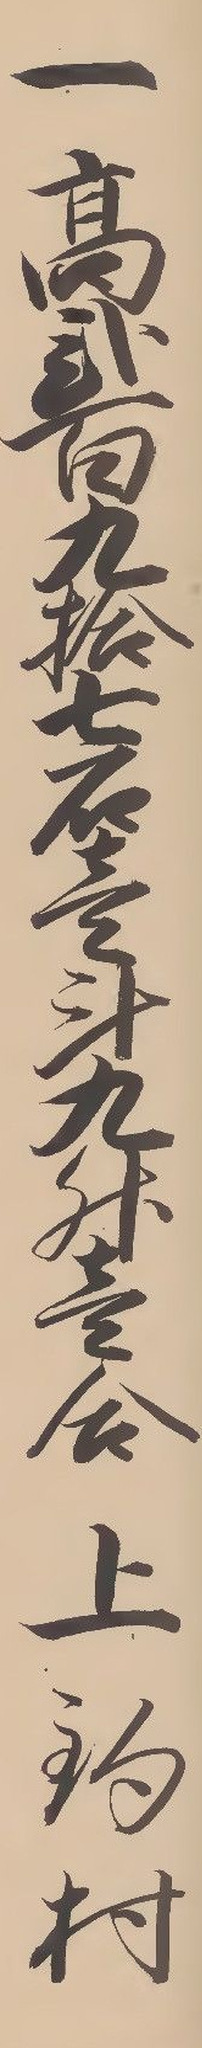一高弐百九拾七石壱斗九升壱合上鈎村
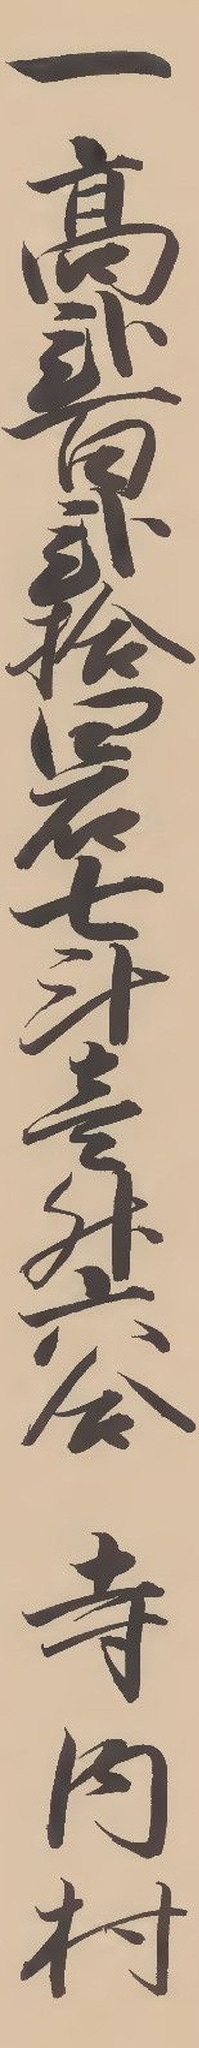一高弐百弐拾四石七斗壱升六合寺内村
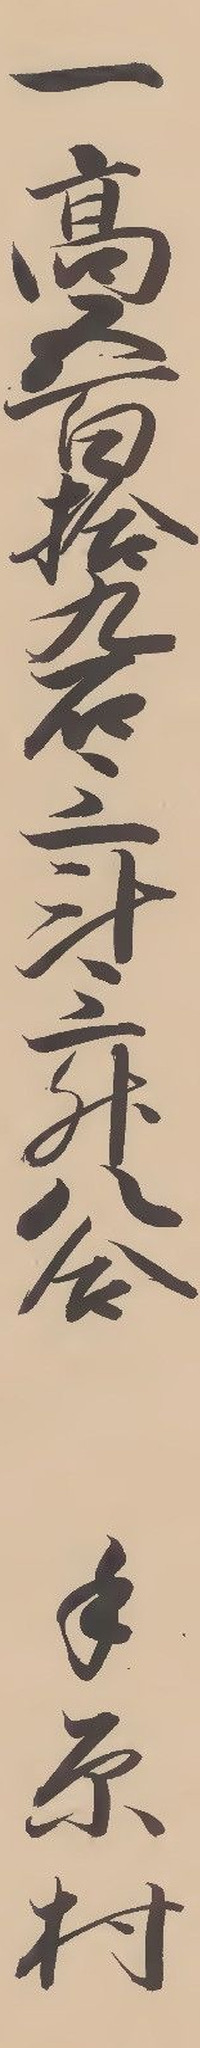一高五百拾九石三斗三升八合手原村
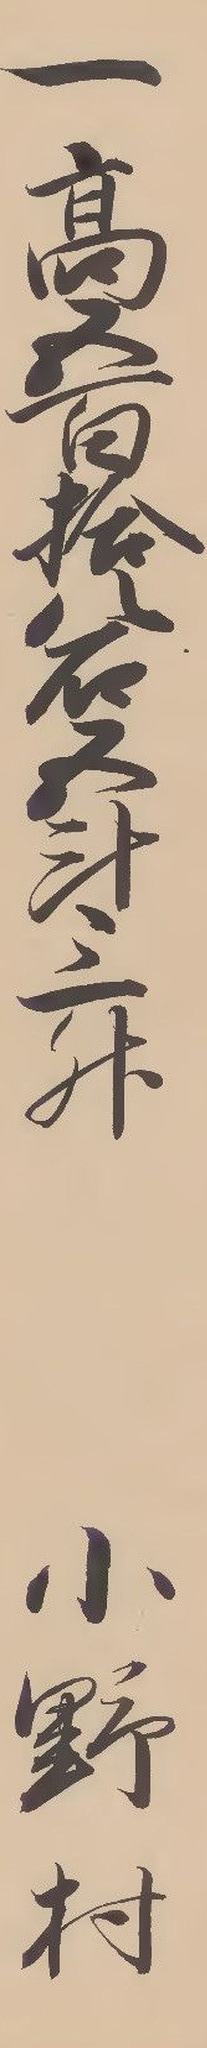一高五百拾八石五斗三升小野村

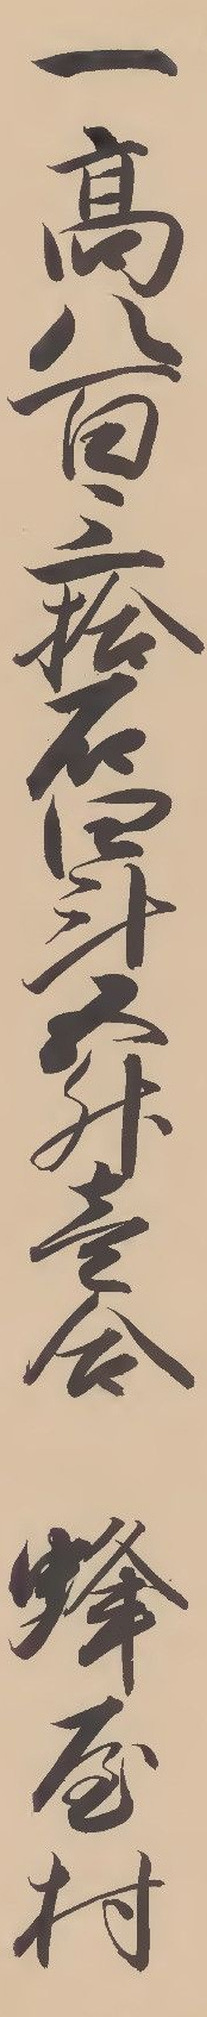一高八百三拾石四斗五升壱合蜂屋村
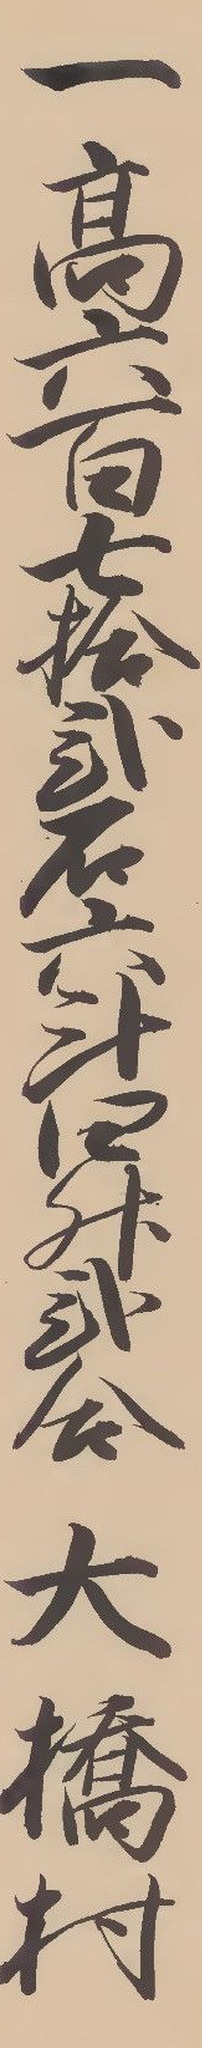一高六百七拾弐石六斗四升弐合大橋村
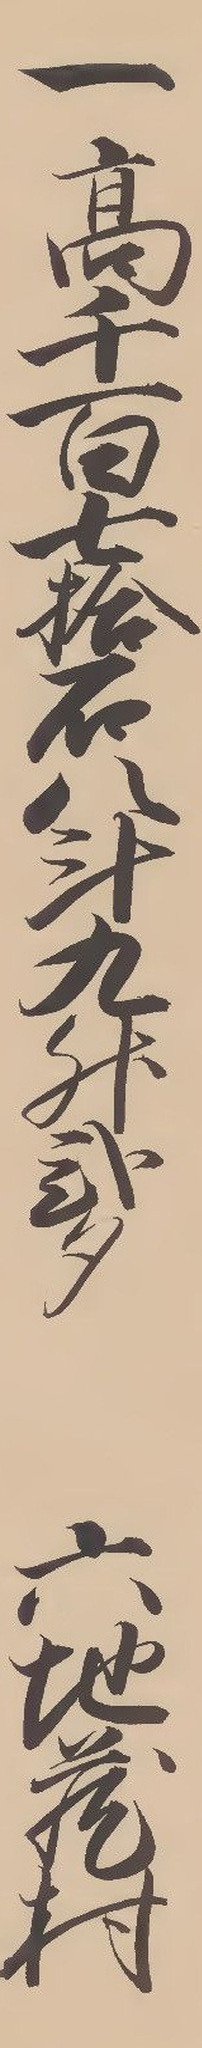一高千百七拾石八斗九升弐勺六地蔵村
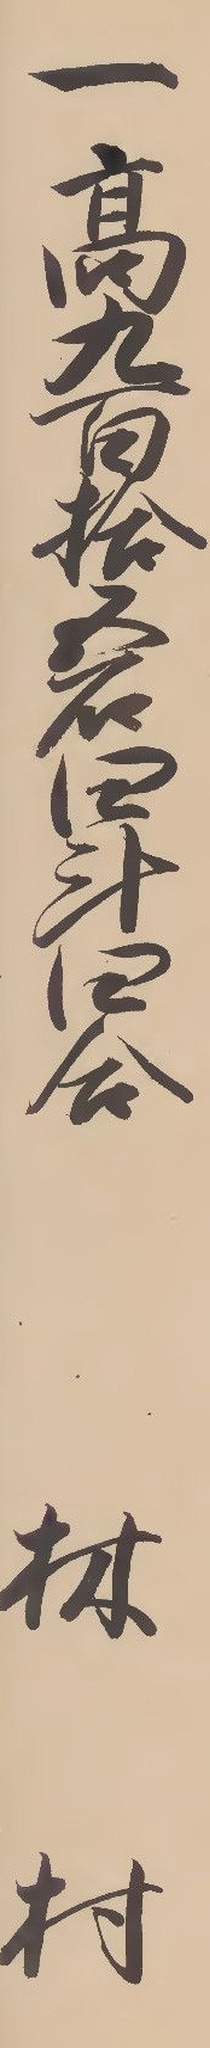一高九百拾五石四斗四合林村
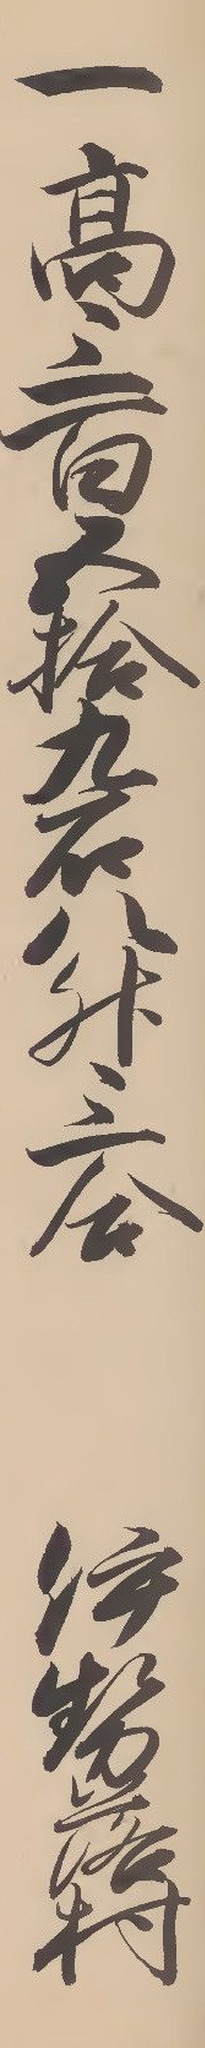一高三百五拾九石八升三合伊勢落村
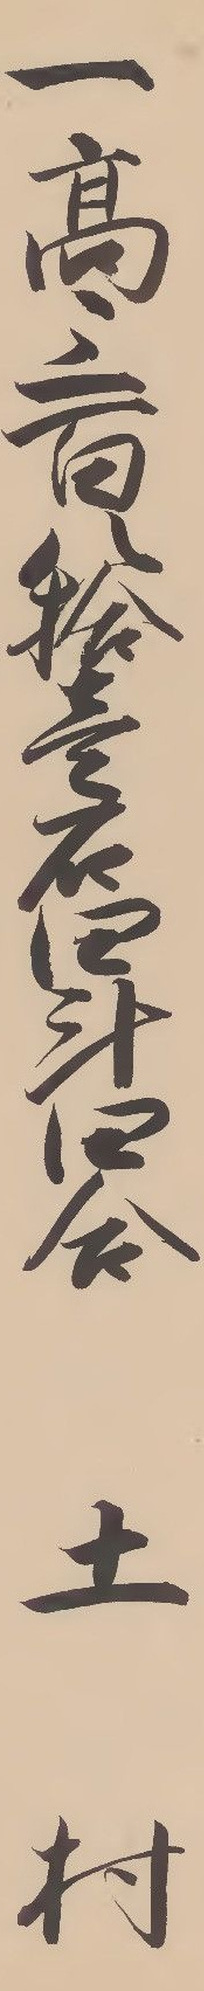一高三百八拾壱石四斗四合土村
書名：近江国郷帳
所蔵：国立公文書館 National Archives of Japan
